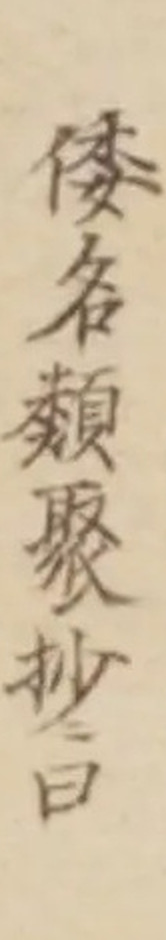倭名類聚抄曰
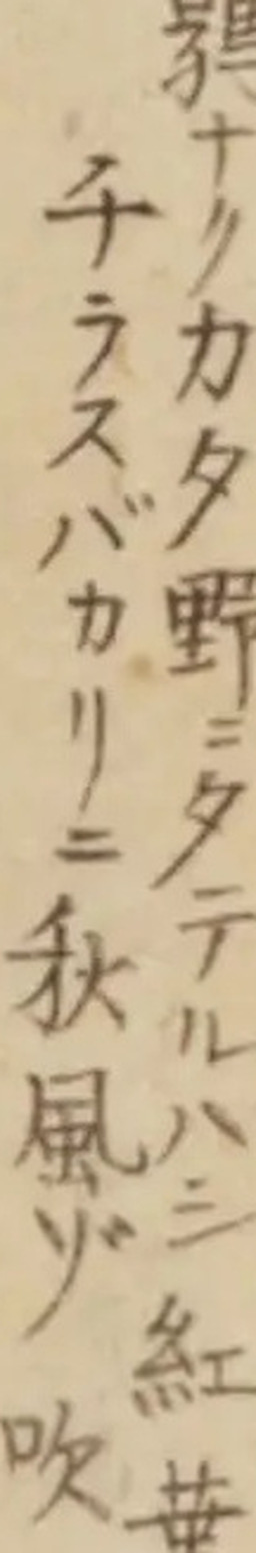チラスバカリニ秋風ゾ吹

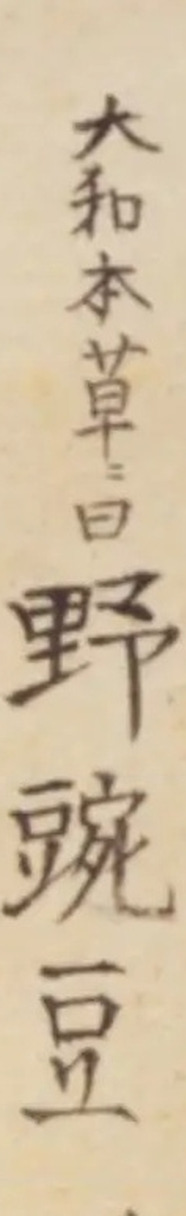大和本草ニ曰野豌豆
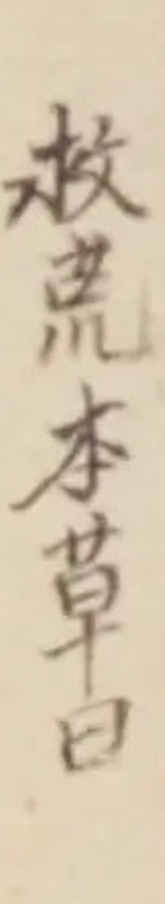救荒本草曰
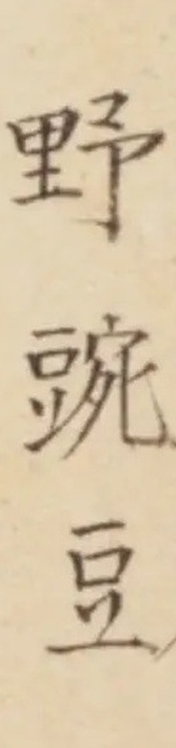野豌豆
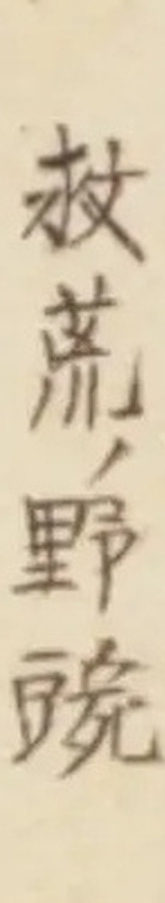救荒ノ野豌
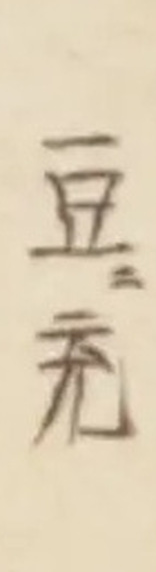豆ニ充
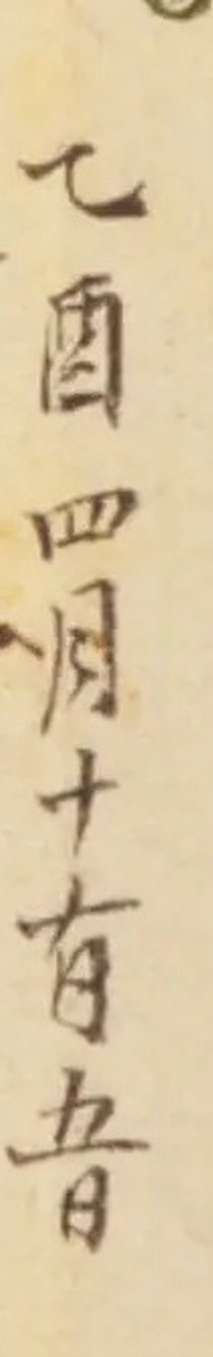乙酉四月十有五日
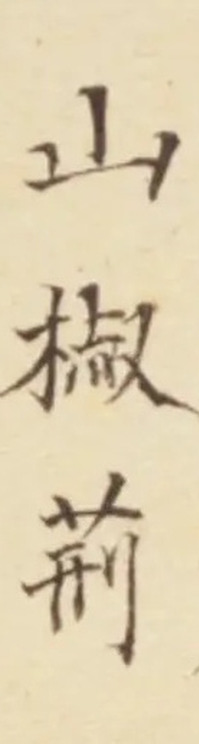山椒荊

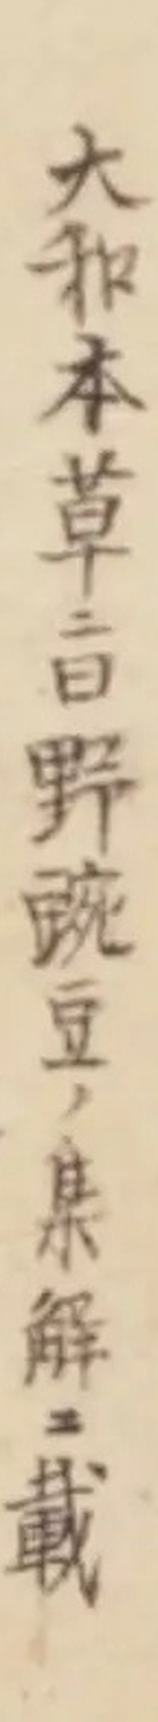大和本草ニ曰野豌豆ノ集解ニ載
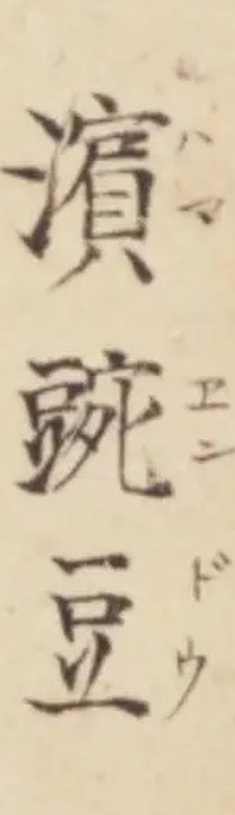浜豌豆
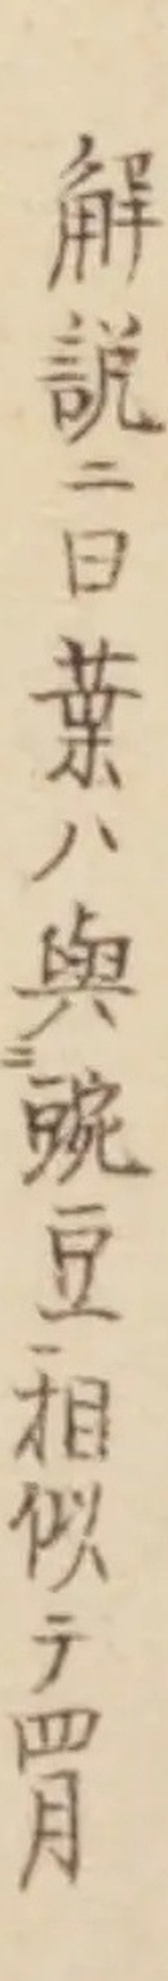解説ニ曰葉ハ与豌豆相似テ四月
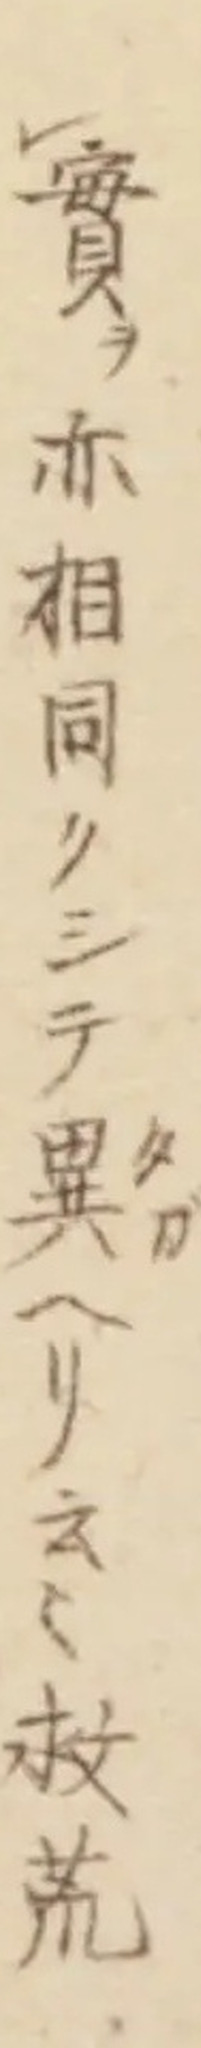実亦相同クシテ異ヘリ云々救荒
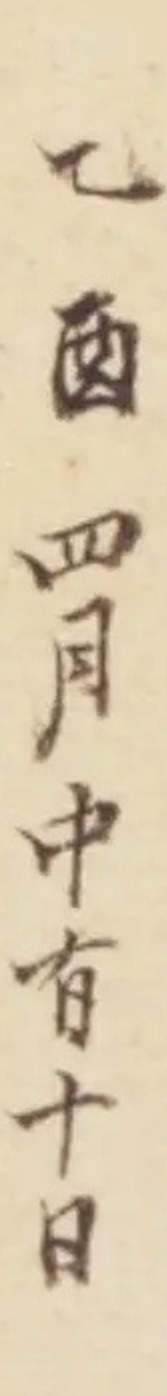乙酉四月中有十日
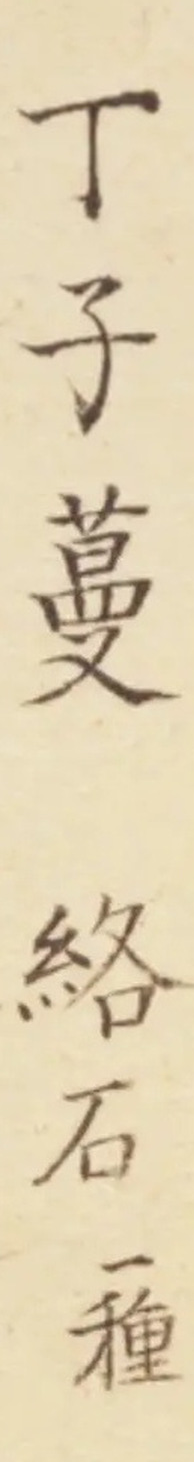丁子蔓絡石一種

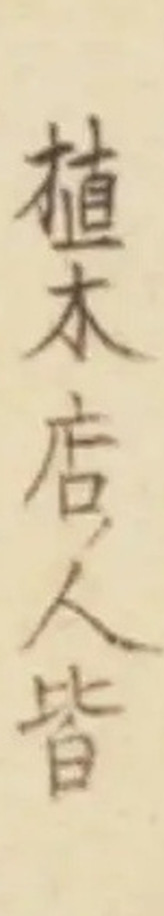植木店の人皆
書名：梅園草木花譜夏之部. 3
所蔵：国立国会図書館 National Diet Library, JAPAN
